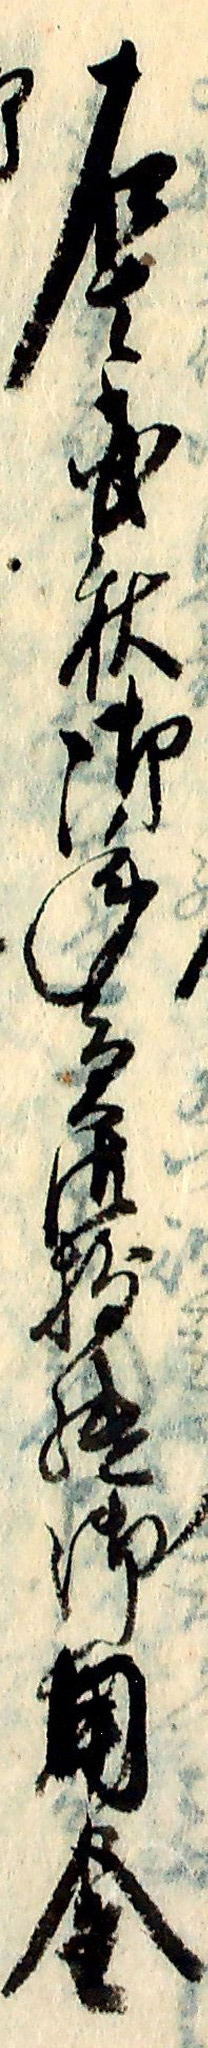右は当秋御年貢御指継御用金
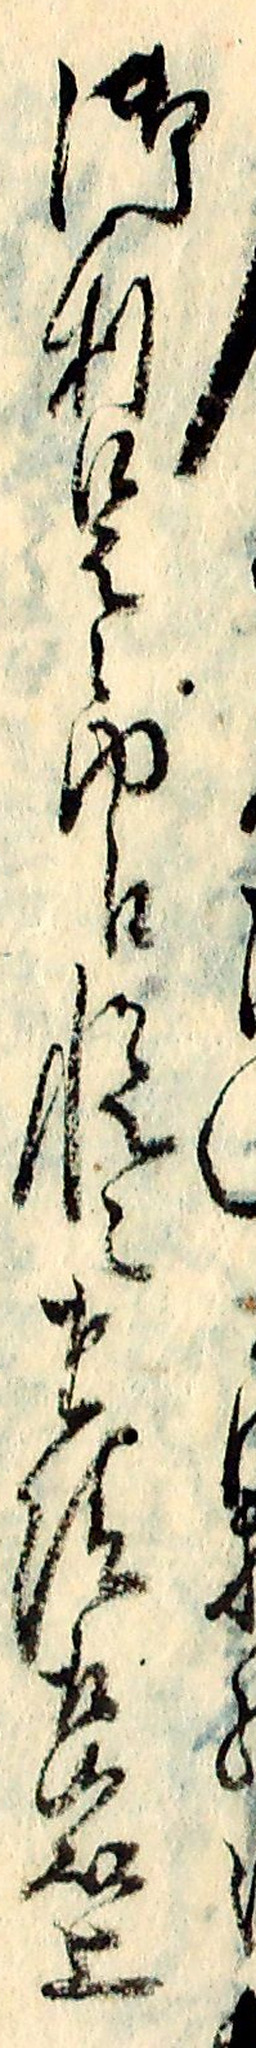御利足之内え慥に奉請取候以上
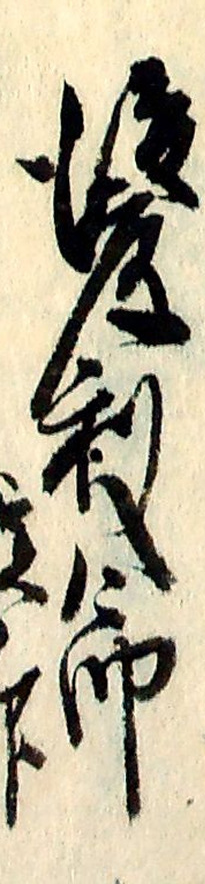後藤利八郎
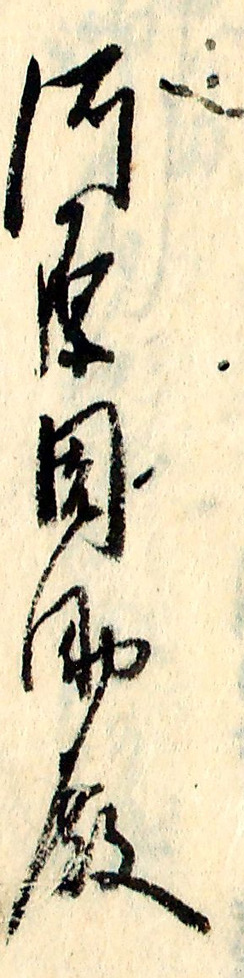河原周助殿

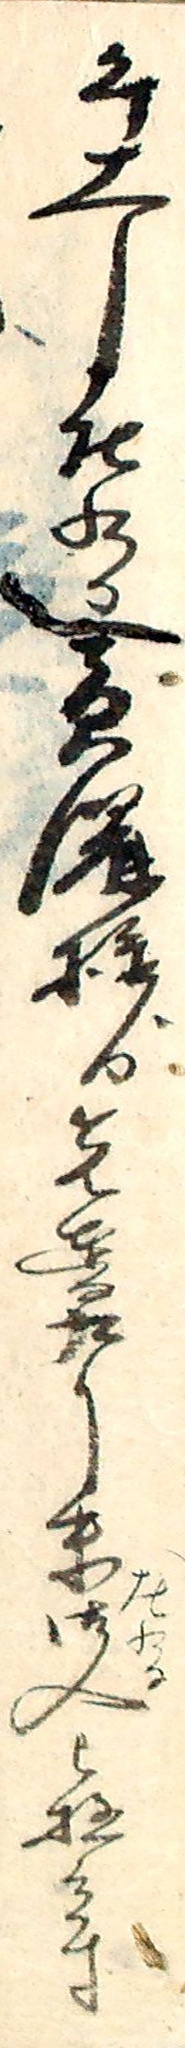午十一月廿九日美濃様ゟ先達て九月末廿九日御入被遊候付
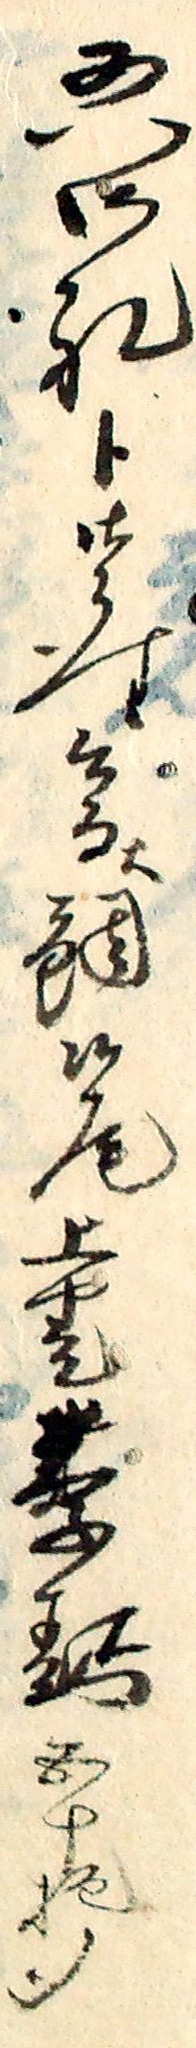右御礼と御座候て大鯛弐尾上竈素麺五十把〆
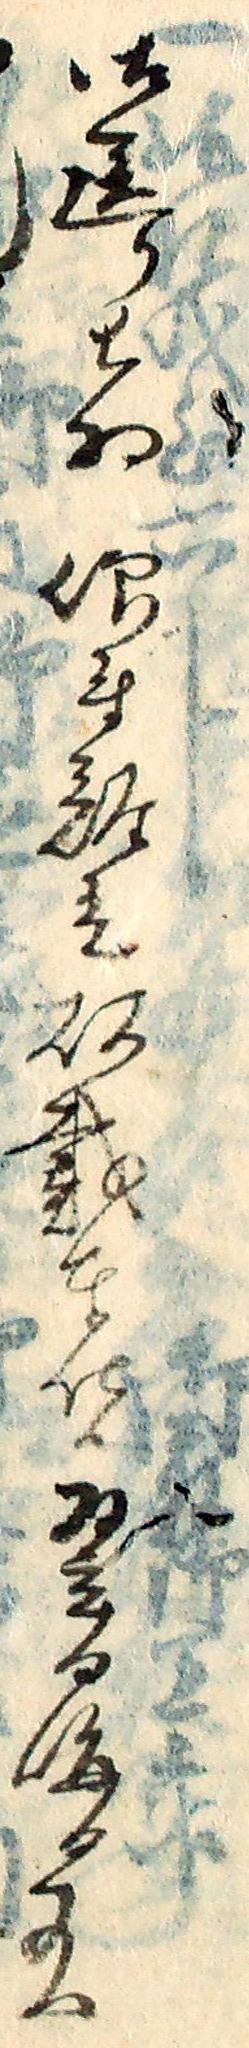御送り被為仰付難有頂戴奉仕候翌日晦日には
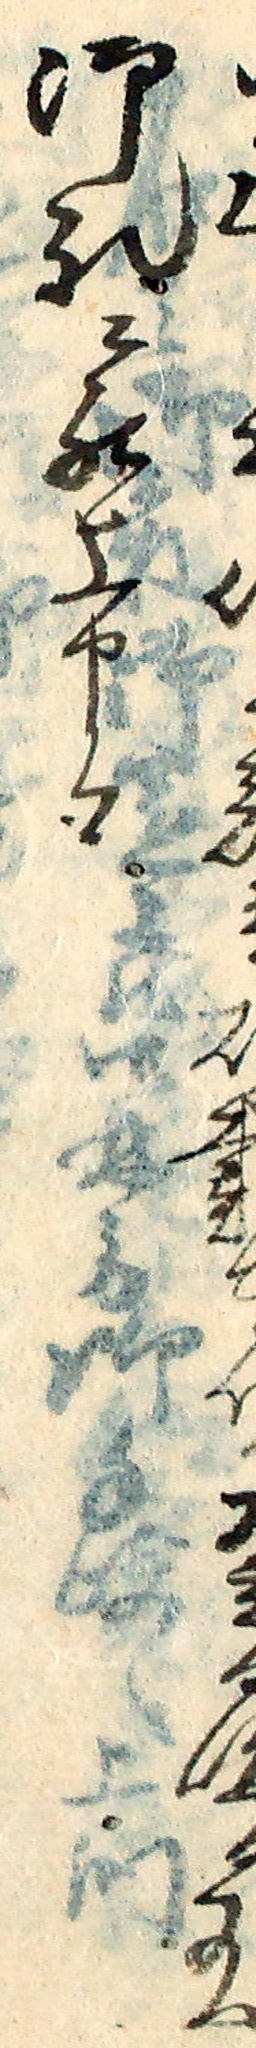御礼に罷上申候
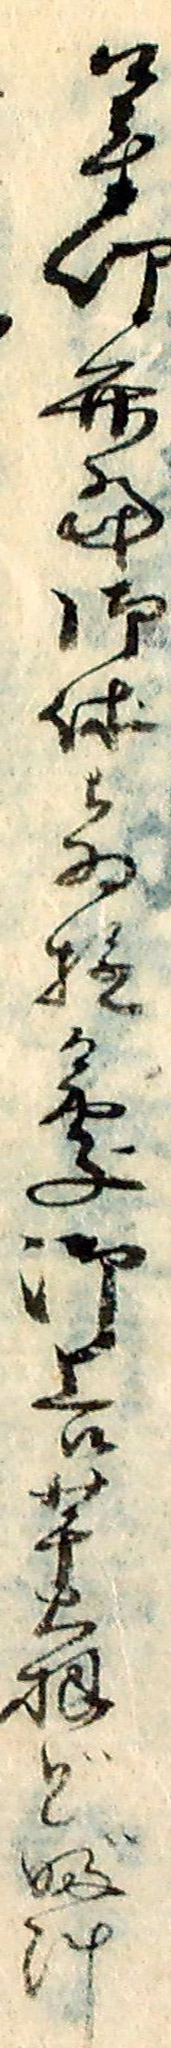御座御弁当御休被為遊候処御上候芋大根どぶ汁
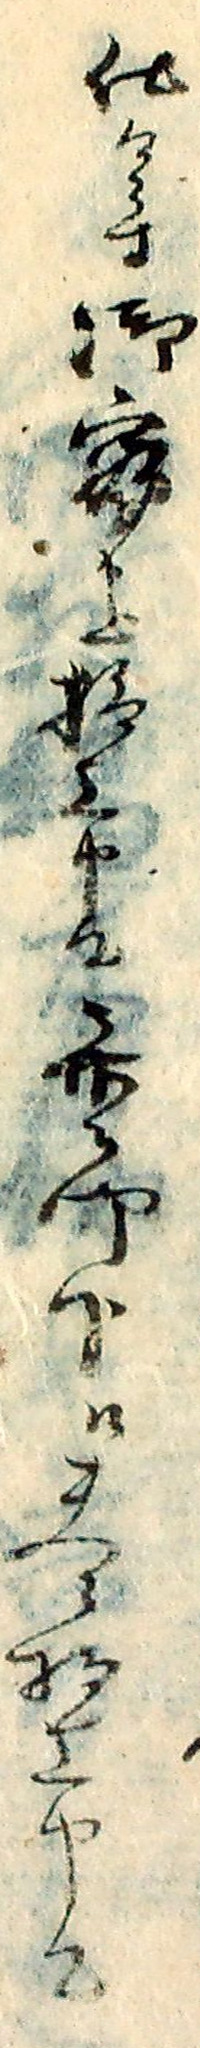仕候付御窺申上指上申候御弁当下け夫々指上申候
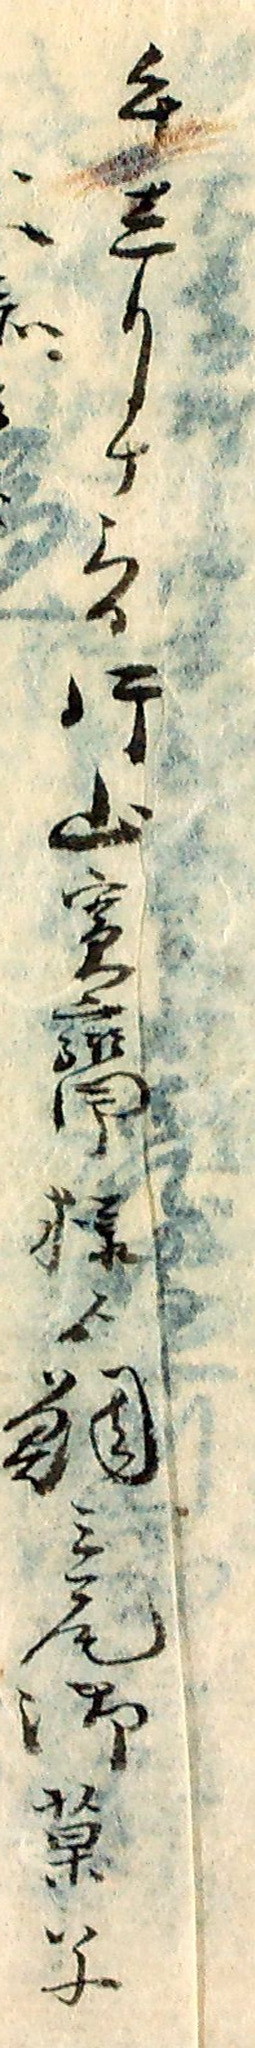午十二月十三日片山寛斎様ゟ鯛三尾御菓子
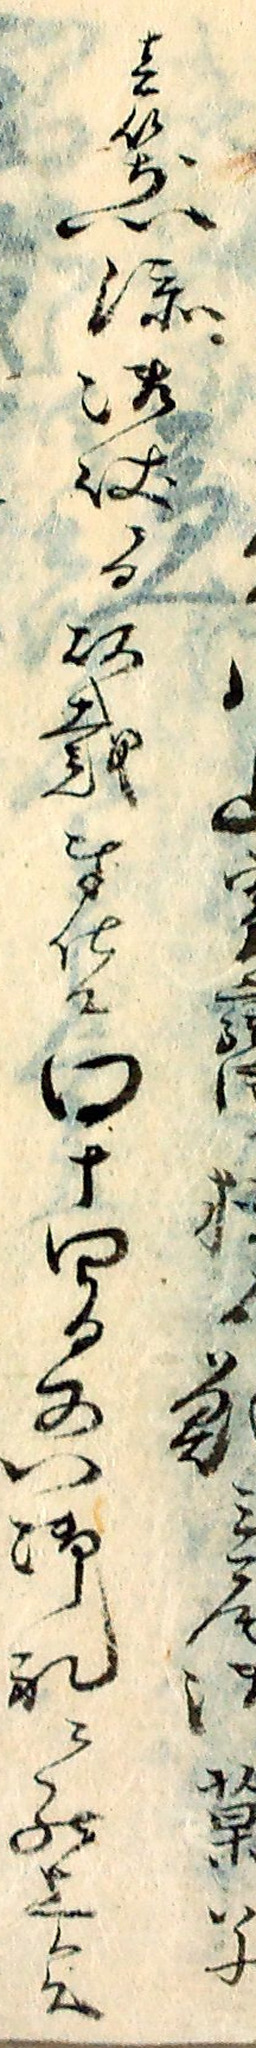壱器添御使にて頂戴奉仕候同十四日右御礼に罷上り候
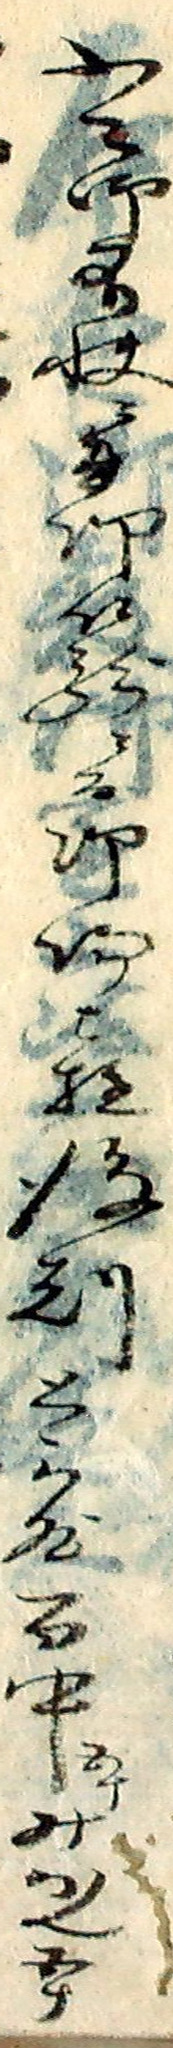少々御不快に付御籠にて御帰被遊後刻とら屋百中五十みかん五十
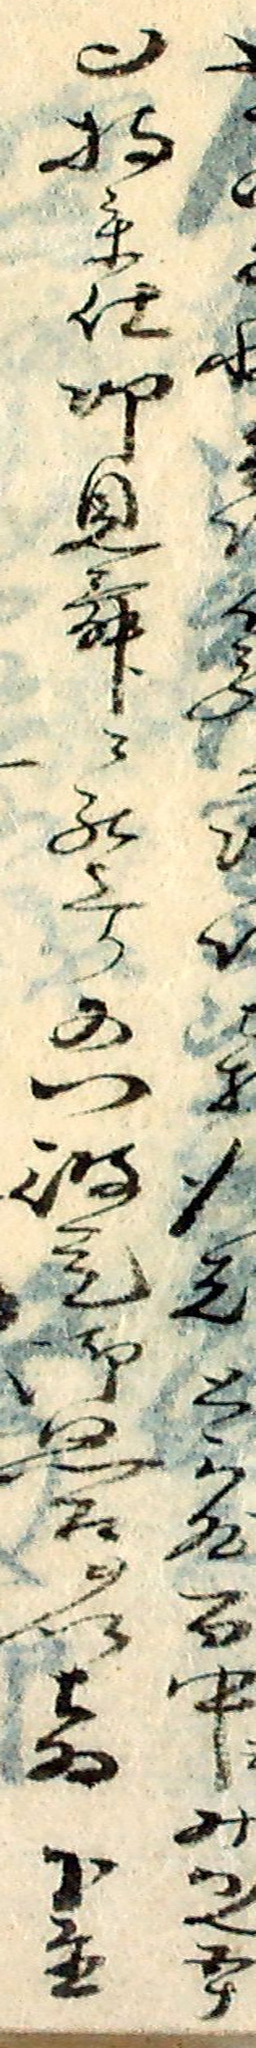〆持参仕御見舞に罷上り右彼是御思召を以被為下置
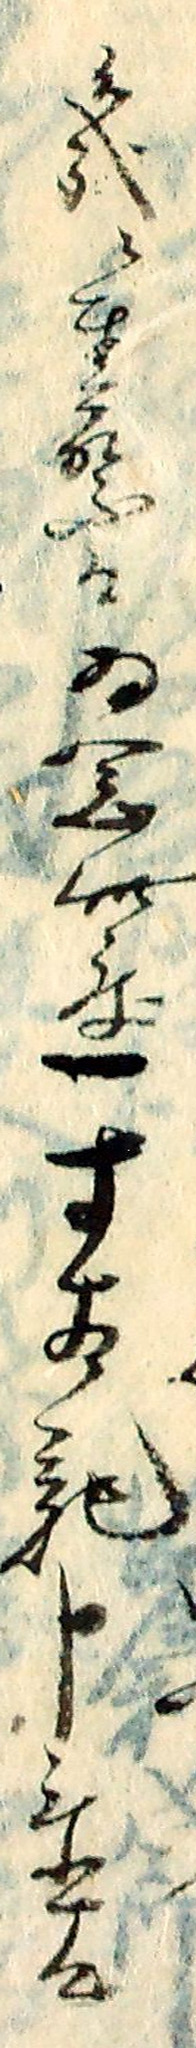候哉に奉察候為念此度一寸相記申置候

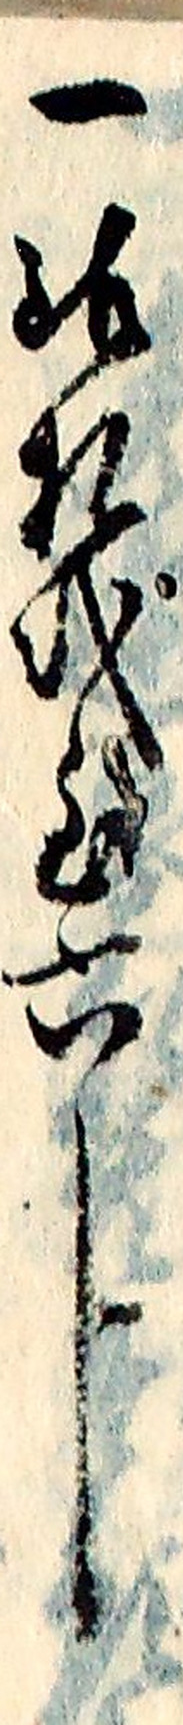一銀拾弐匁六分
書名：諸御願書控(後藤氏壱番）
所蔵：鳴門教育大学 Naruto University of Education
